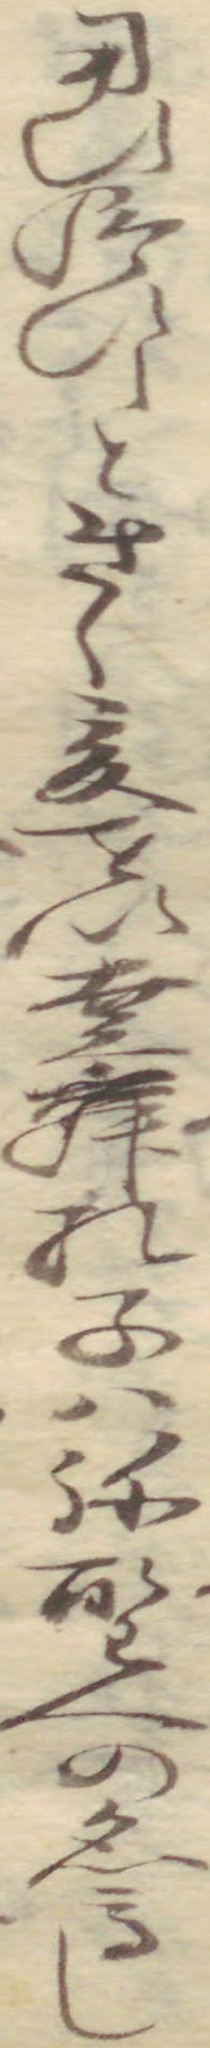用ひ給ひしときく爰を以堯舜孔子は弥聖人の名高し
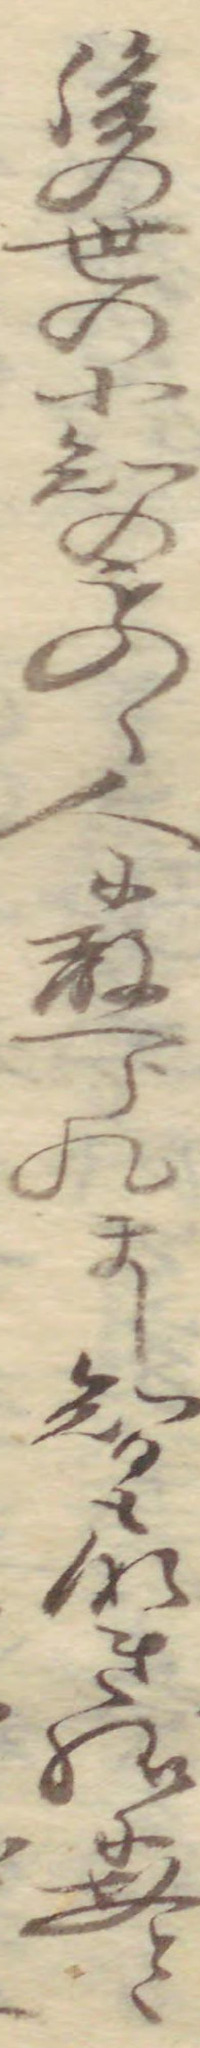後の世の小知のものゝ人に教へられまし智もなき様になとゝ
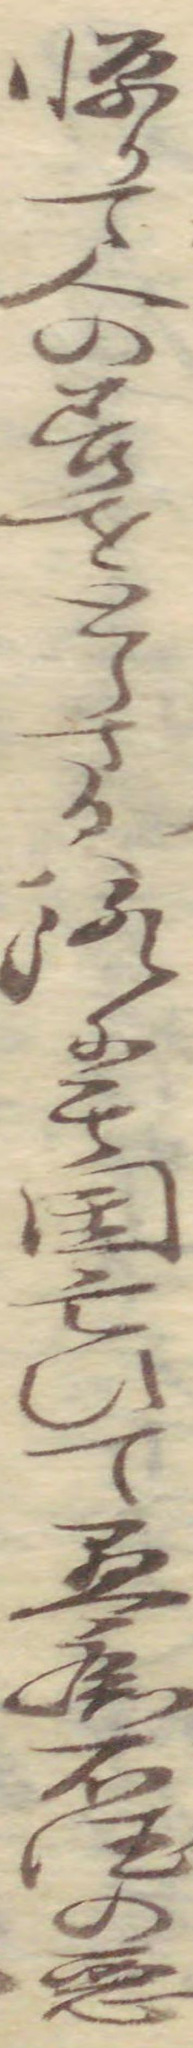憚りて人の善をとらさるは終に其国亡ひて愚痴不徳の悪
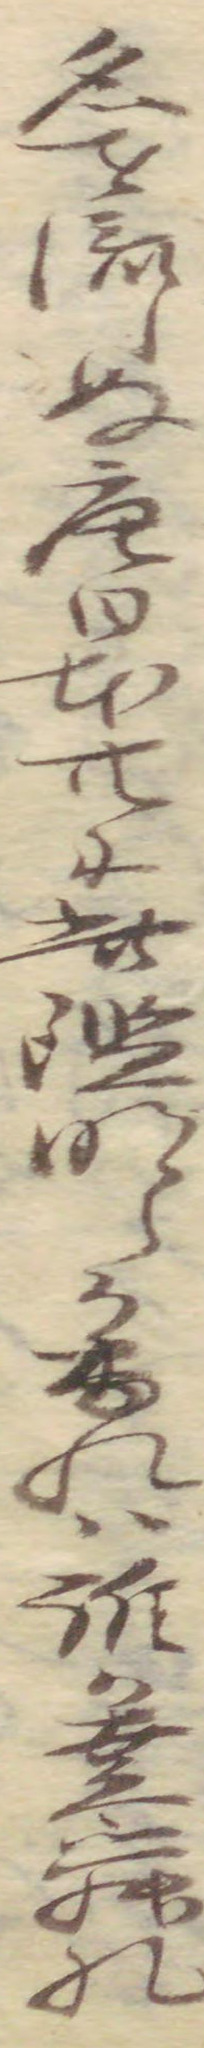名を流しぬ唐日本共に此鑑明らかなれは誰か堯舜孔
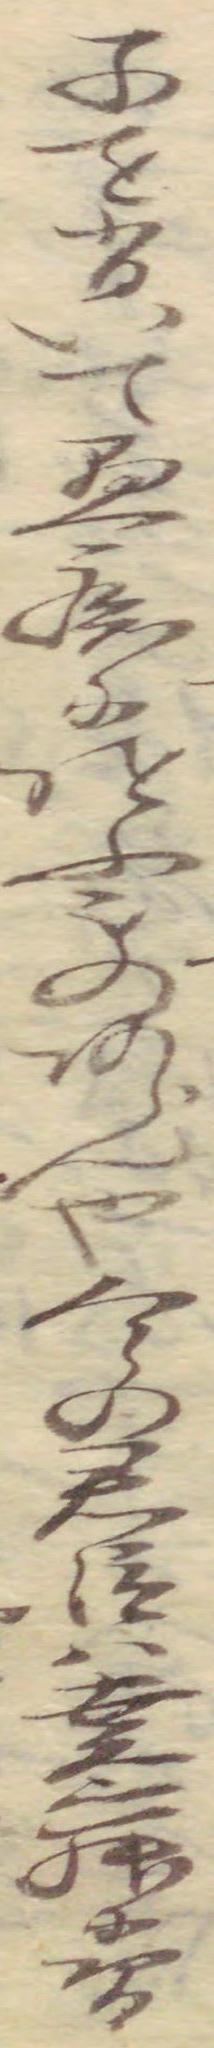子を背いて愚痴に随ふものあらんや今の君臣は堯舜に習
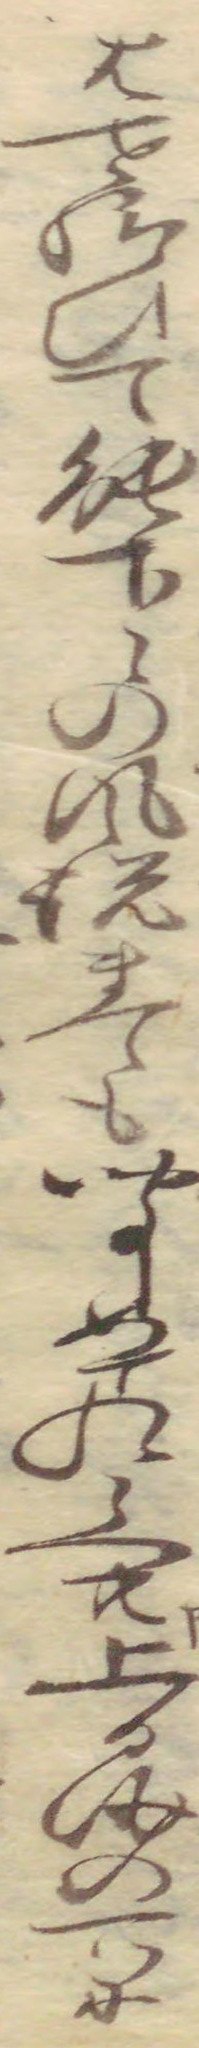はせ給ひて能下〻の風説まても聞しめされ候へ共申上る儀の可に
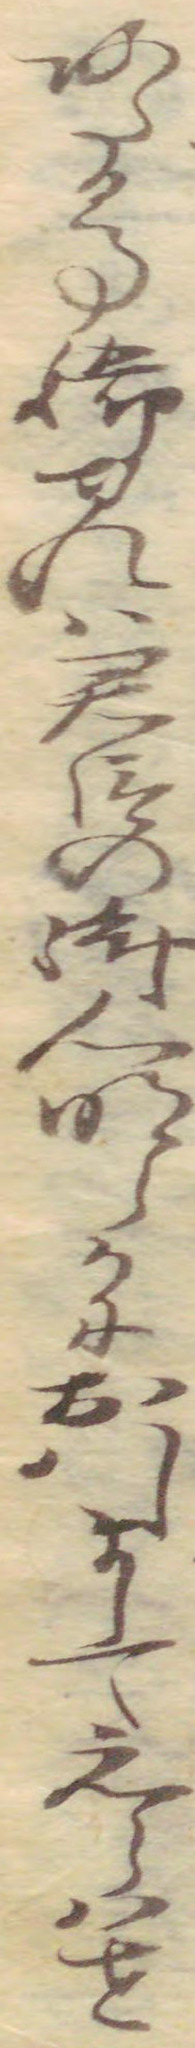あたる事稀なれは君臣の御心明らかにおはしましてえらはせ

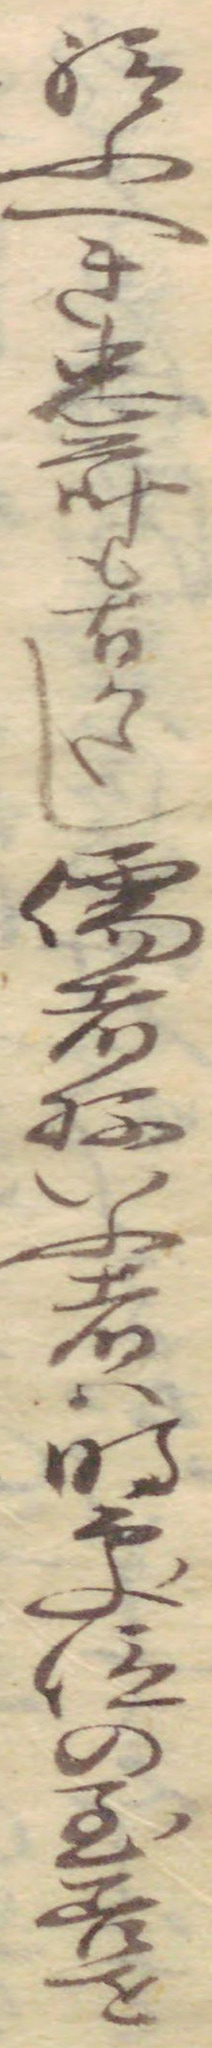給ふへき忠節も有かたし儒者抔いふ者は時処位の至善を
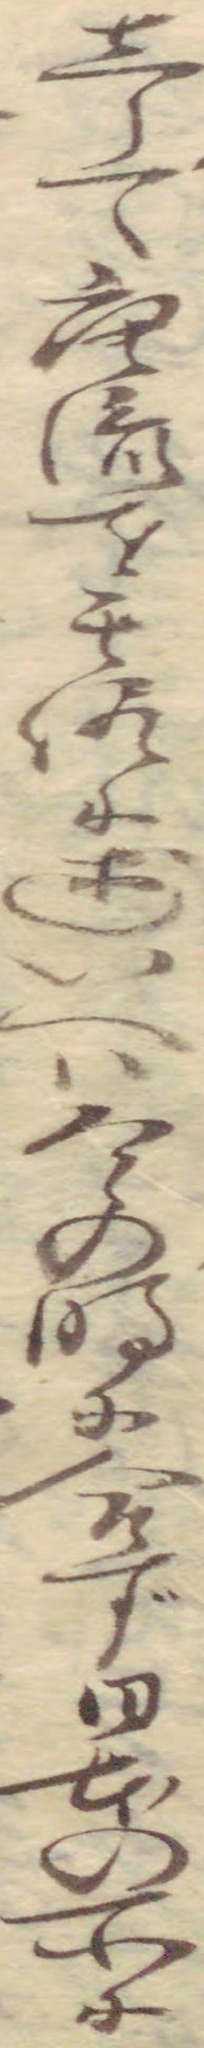しらて唐流を其侭に述いへは今の時に合ず日本の所に
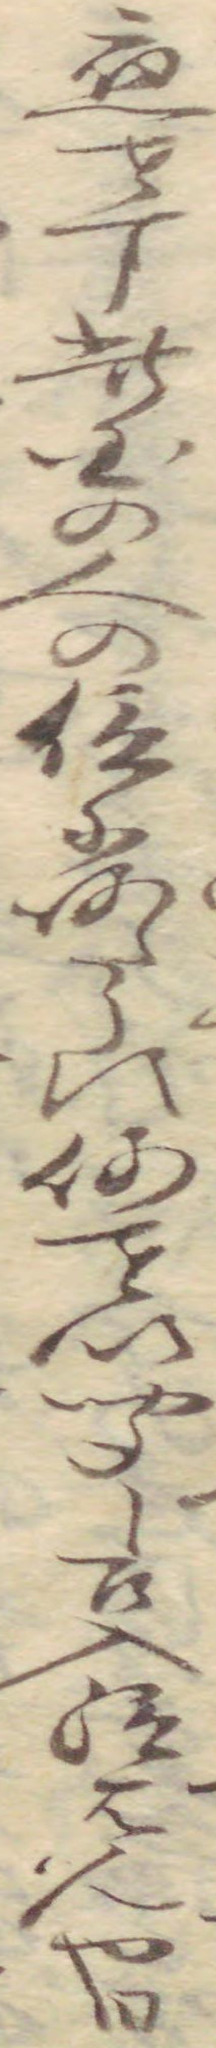応せす此国の人の位にあたらす何を以聞し召入給はんや日
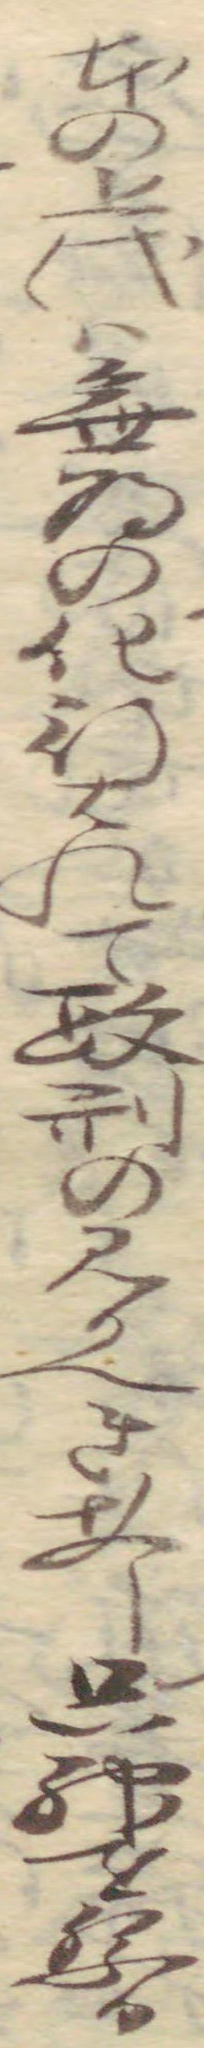本の上代は無為の化行はれて政刑の見るへきなし只神を祭る
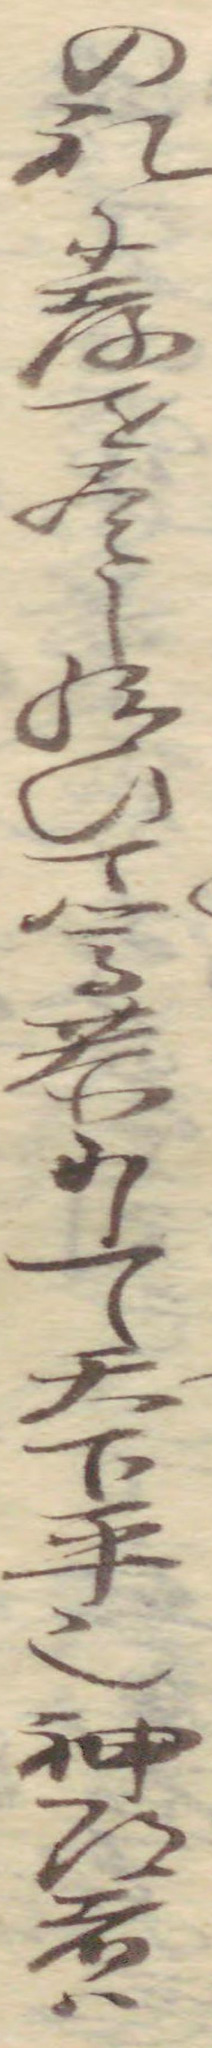の礼に孝を尽し給ひて篤恭にして天下平也神道者は
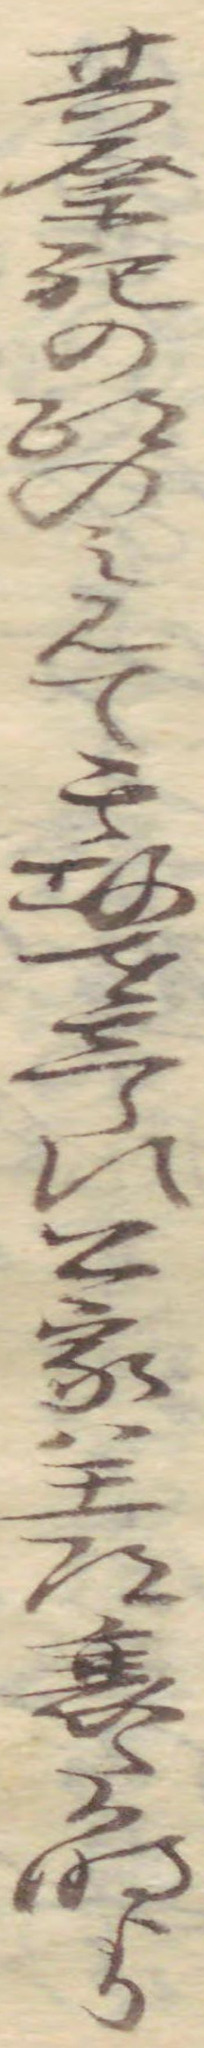其祭記の跡のみ見て其故をしらす公家は王道衰たる時より
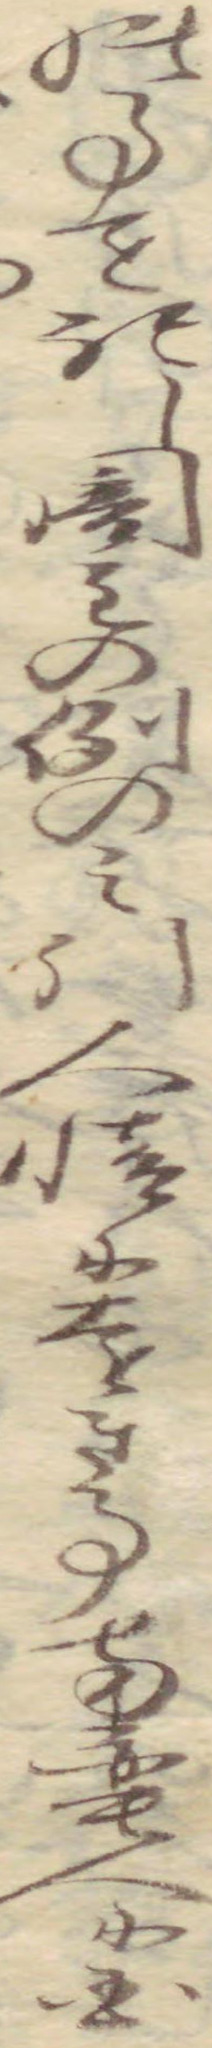の事を記し闇主の例のみ引人情に遠き事南蛮人に国
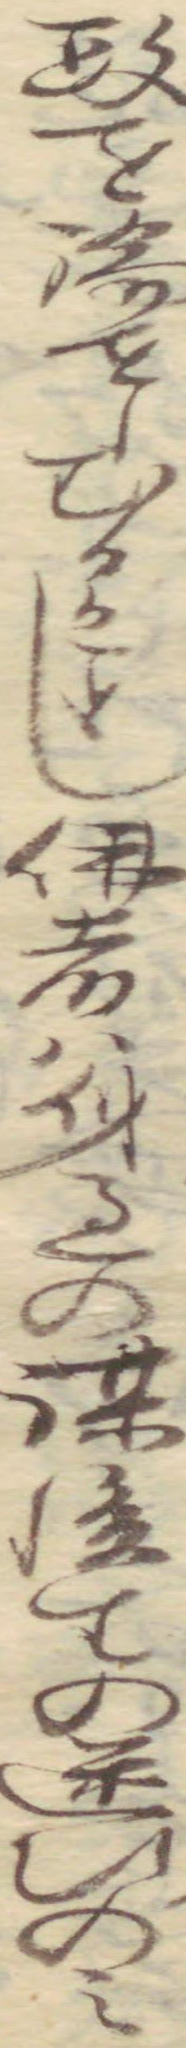政を論せしむるかことし仏者は身過の謀後生の迷ひのみ
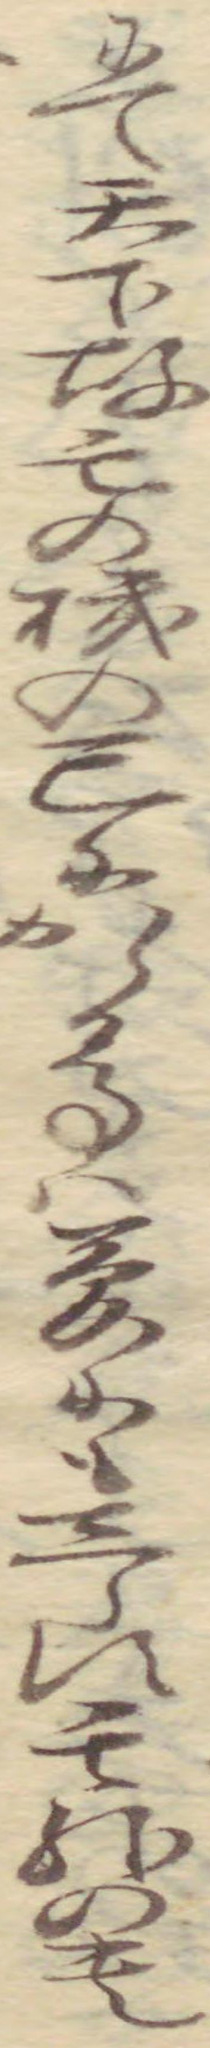にて天下存亡の機のみにかゝる事は夢にもしらす其外の貴
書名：鶯宿雑記. 巻263-264
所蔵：国立国会図書館 National Diet Library, JAPAN
